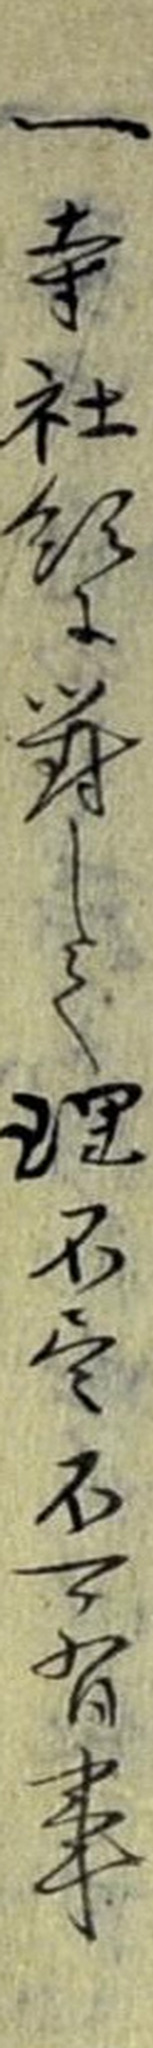一寺社領に対して理不尽不可有事
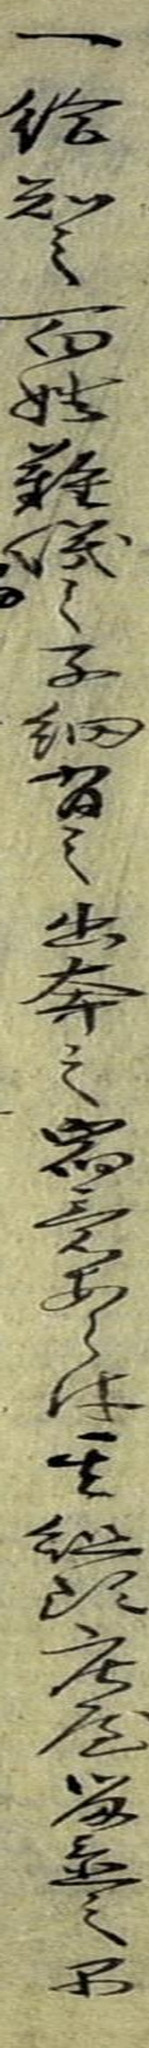一給知之百姓難儀之子細有之出奔之宿意あらは其組頭庄屋留置之早
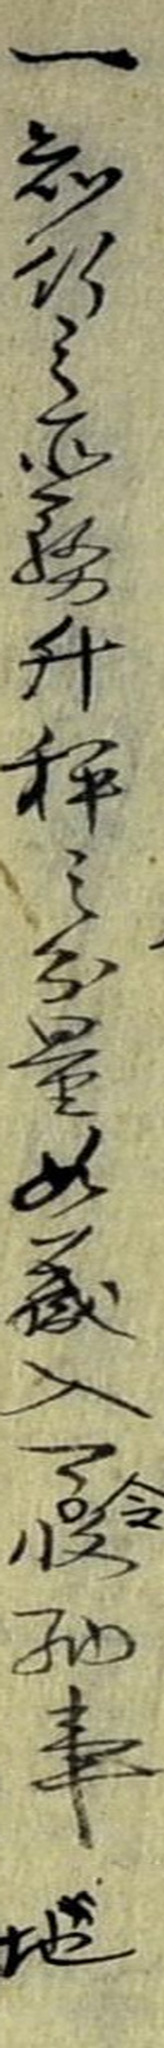一知行之所務升秤之分量如蔵入可◦令収納事
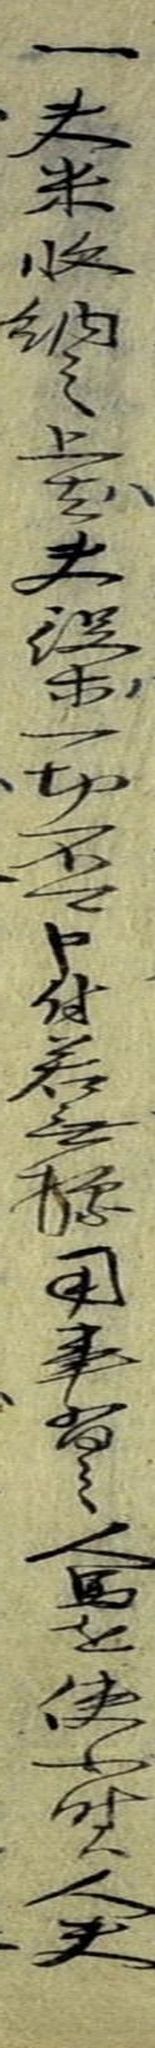一夫米収納之上者夫役等一切不可申付若無拠用事有之人馬を使ふ時ハ人夫
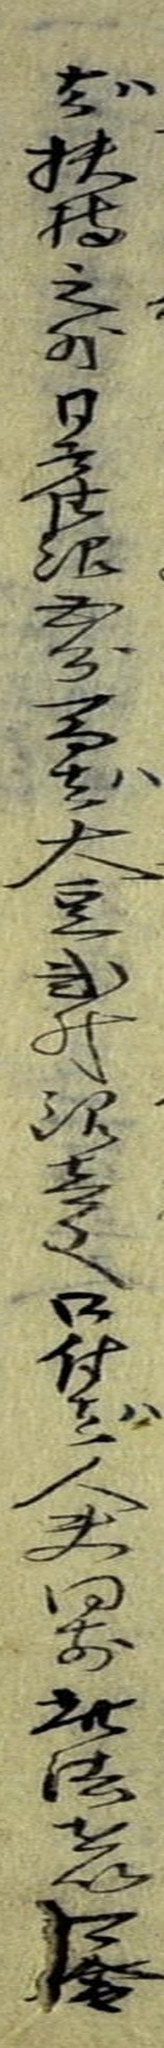者扶持之外日雇銀五分馬者大豆弐升銀壱匁口付者人夫同前此法を以可令
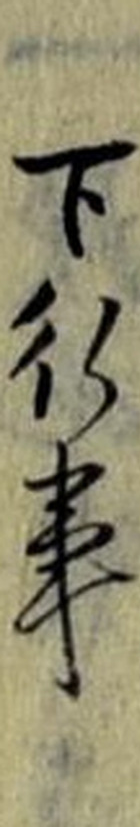下行事
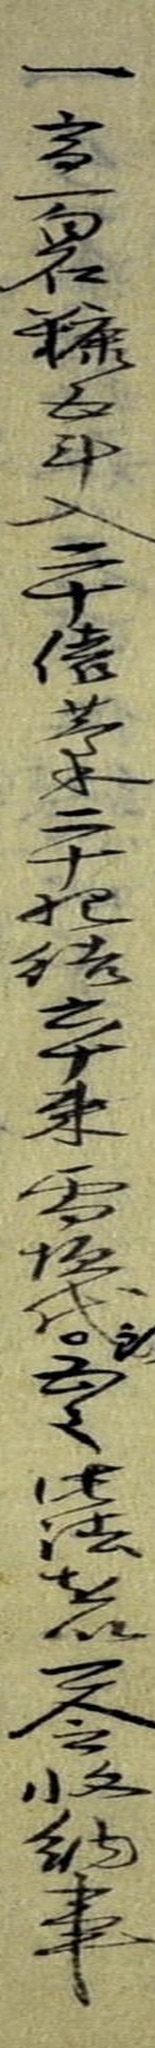一高百石糠五斗入二十俵稾二十把結六十束雪垣代◦銀五匁此法を以可令収納事
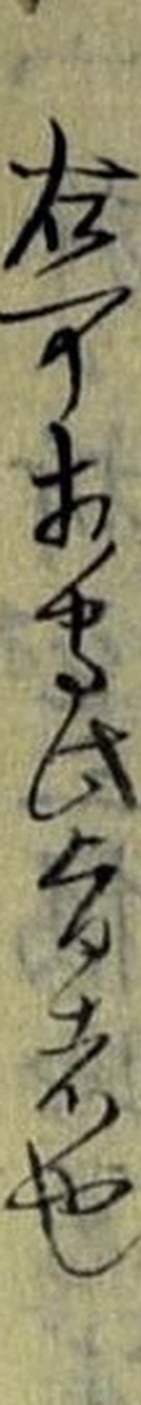右可相守此旨者也
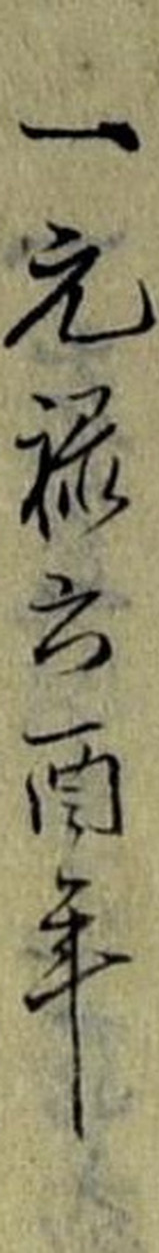一元禄六酉年
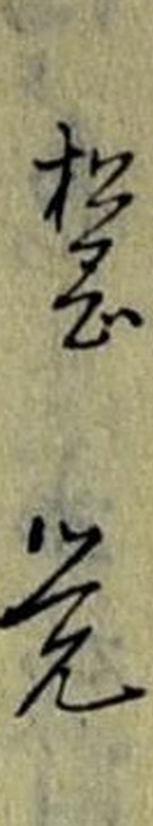松岡覚
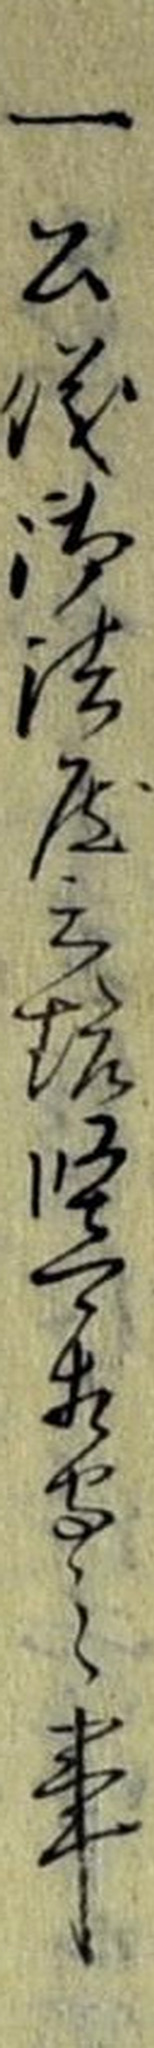一公儀御法度之趣堅可相守之事
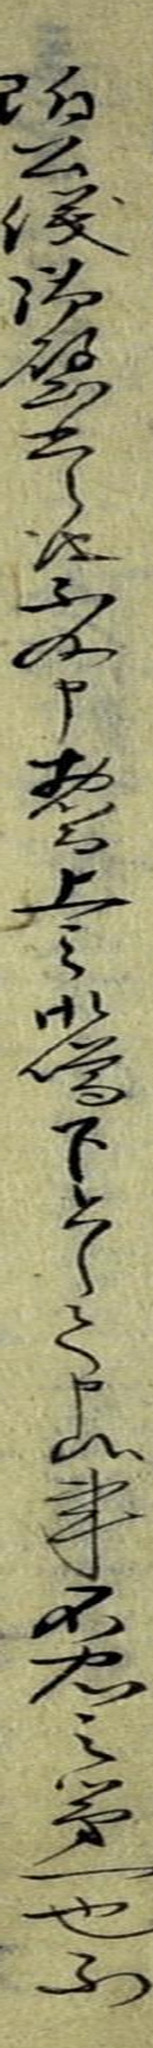附公儀御壁書之儀不及申惣而上之御噂下として申候事不忠之第市一也不
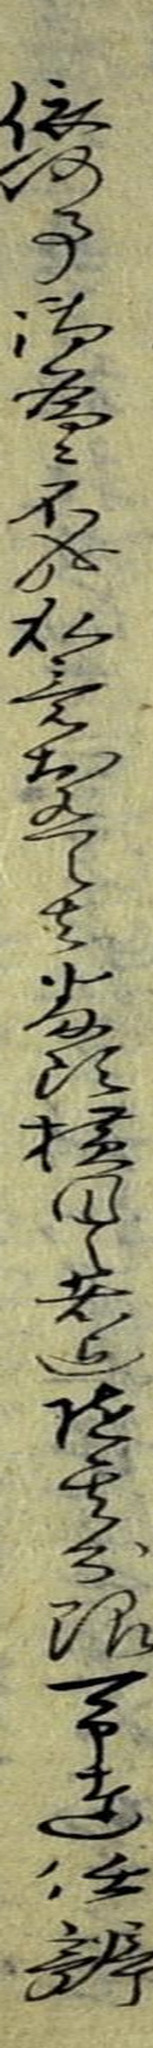依何事御為ニ不成私意於有之者番頭横目之者迄随其分限可申達任弁
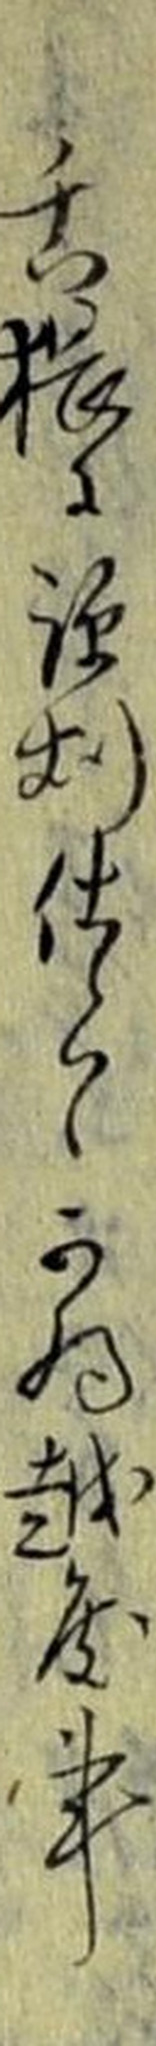舌猥に評判仕候ハヽ可為越度事
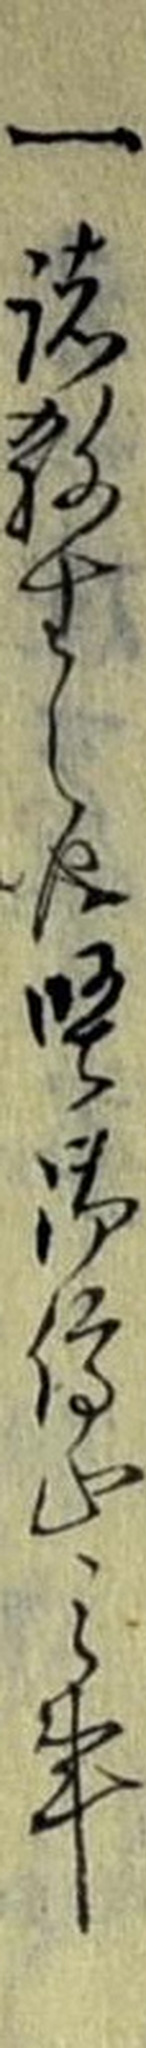一諸殺生之儀堅御停止之事
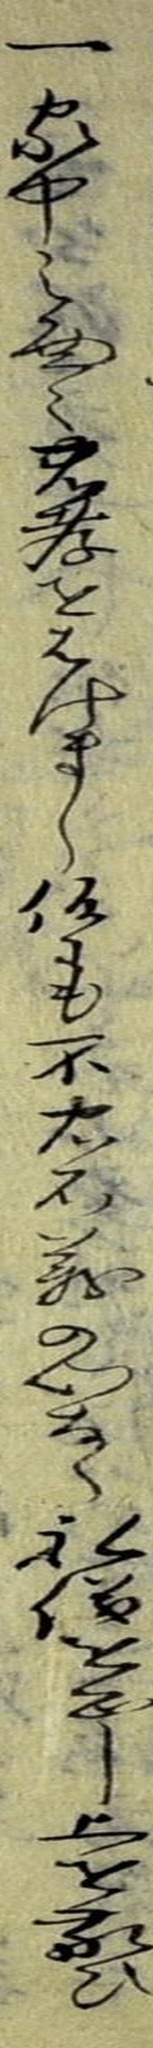一家中之面々忠孝をはけまし仮にも不忠不義之心なく礼儀を正し上を敬ひ
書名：命令之部 一
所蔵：福井県文書館 Fukui Prefectural Archives
